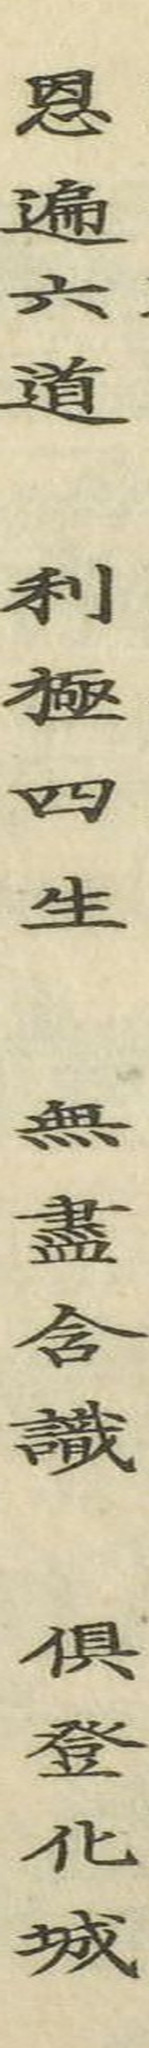恩遍六道利極四生無盡含識俱登化城
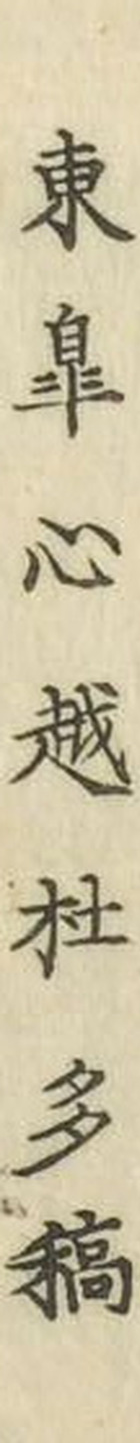東皐心越杜多稿
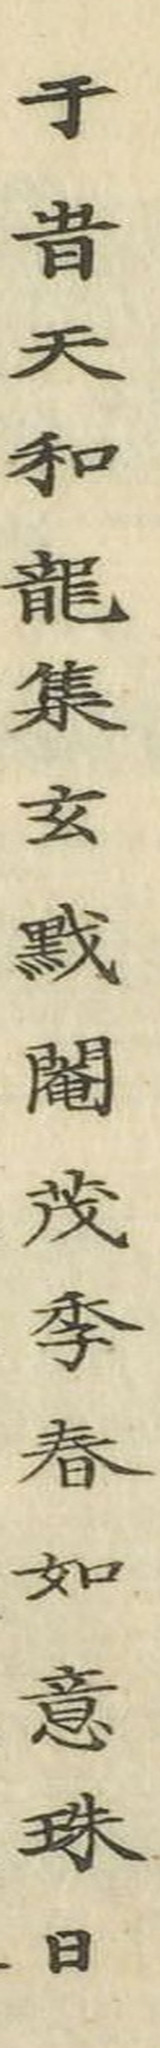于時天和龍集玄閹茂季春如意珠日
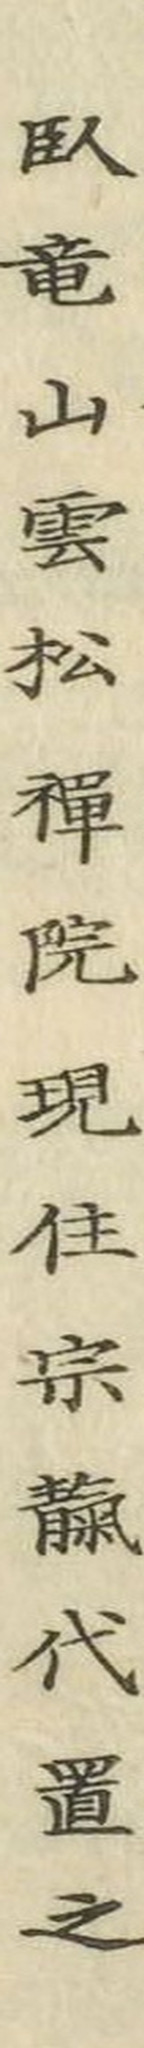臥竜山雲松禅院現住宗靝代置之
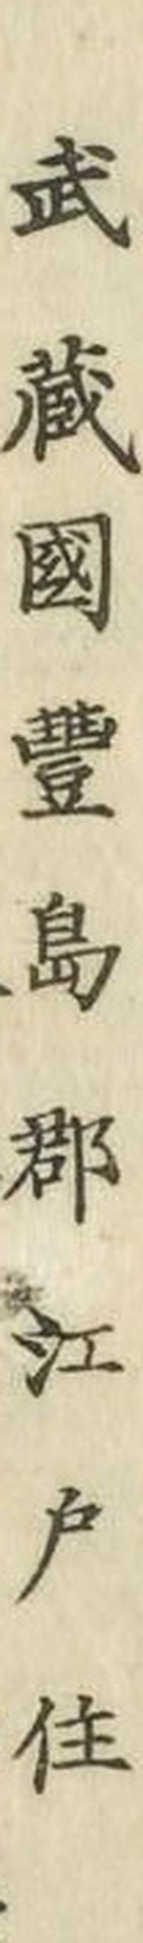武藏國豐島郡江戸住
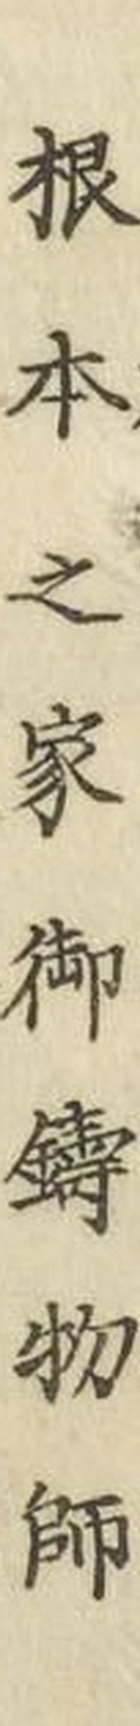根本之家御鑄物師
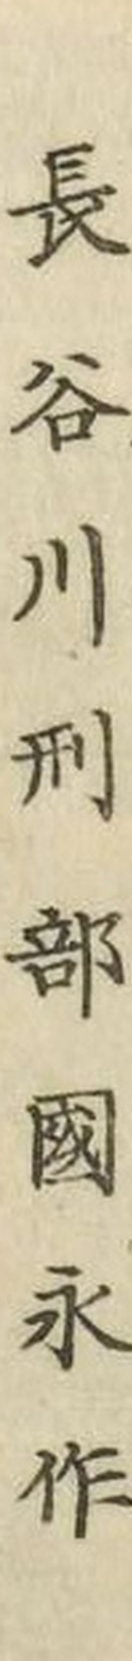長谷川刑部國永作
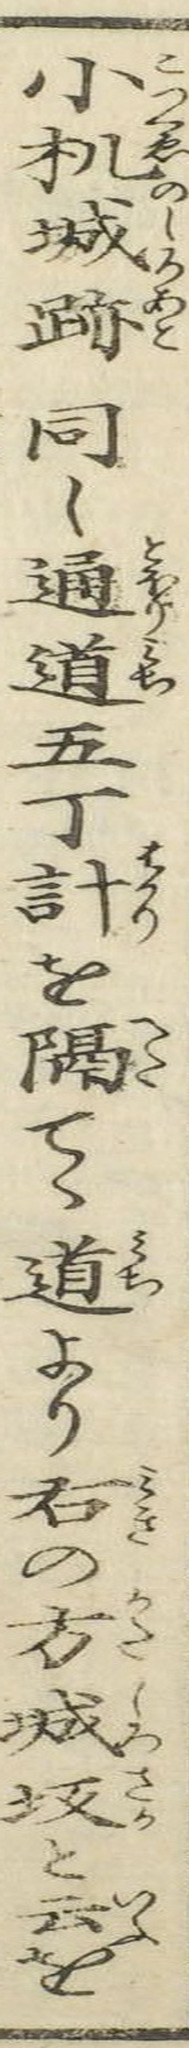小机城跡同し通道五丁計を隔てゝ道より右の方城坂と云を
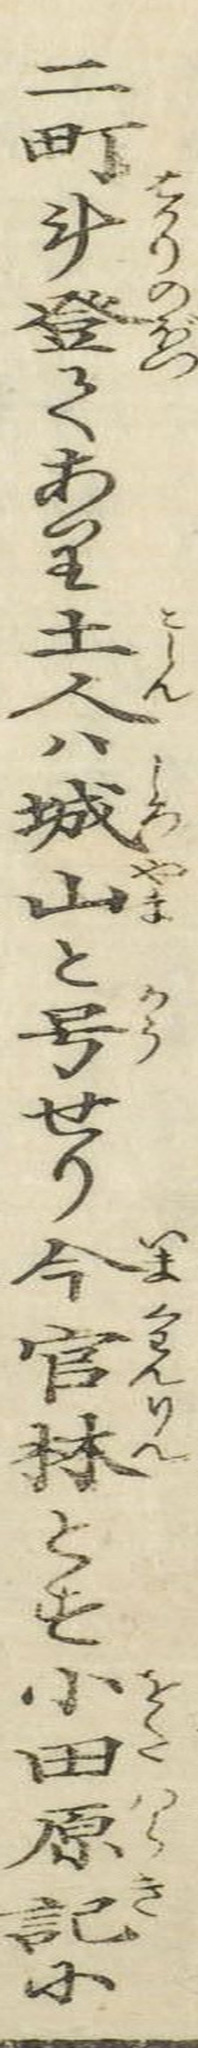二町斗登てあり土人は城山と号せり今官林とす小田原記に
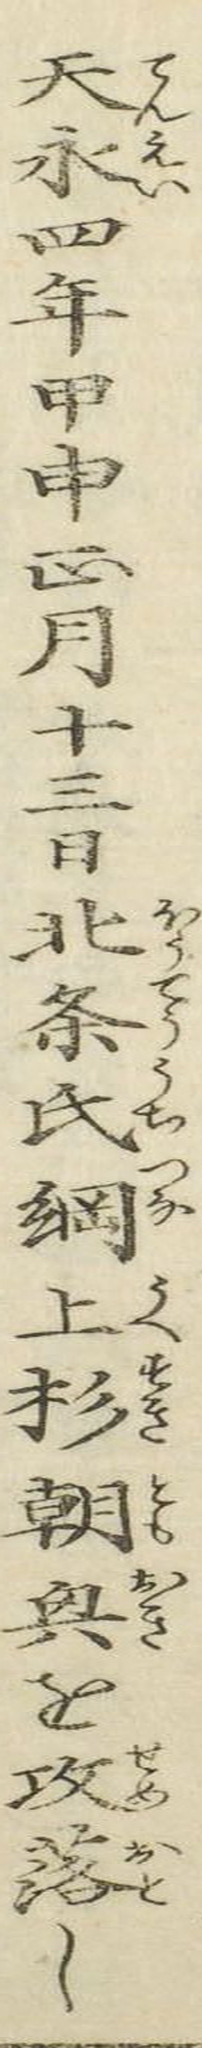天永四年甲申正月十三日北条氏綱上杉朝興を攻落し
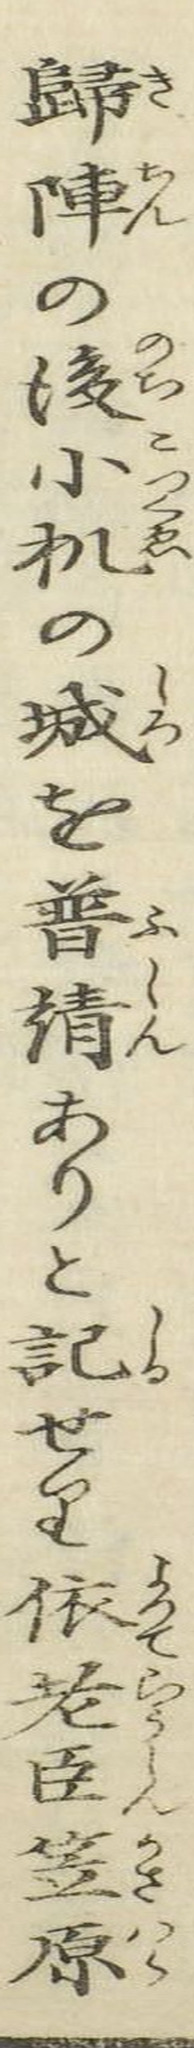歸陣の後小机の城を普請ありと記せり依老臣笠原
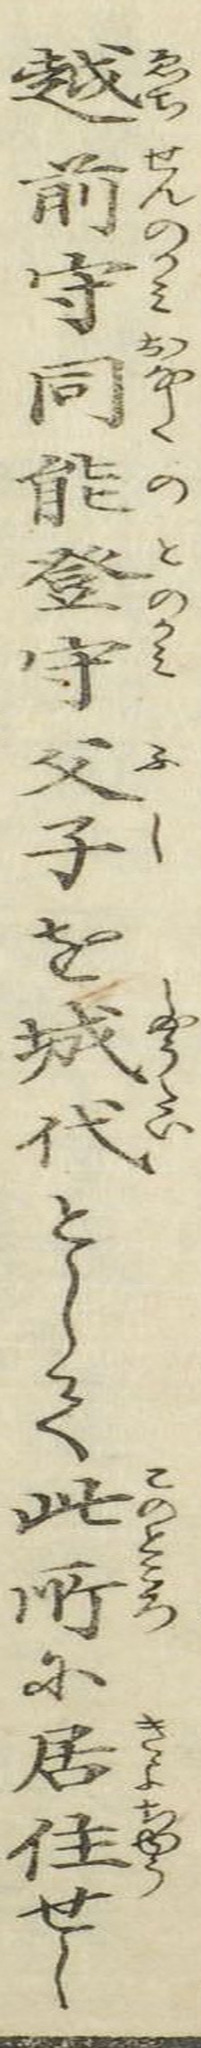越前守同能登守父子を城代として此処に居住せし
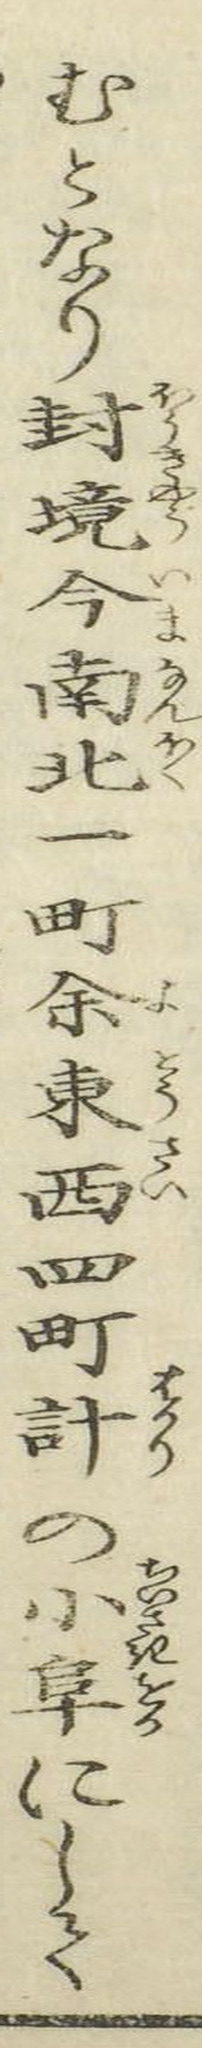むとなり封境今南北一町余東西四町計の小阜にして
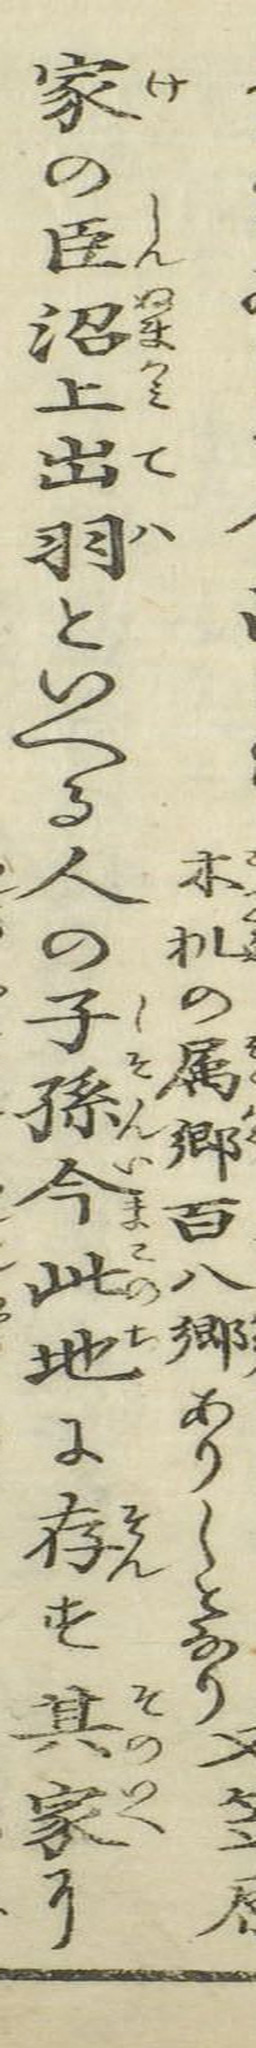家の臣沼上出羽といへる人の子孫今此地に存す其家に
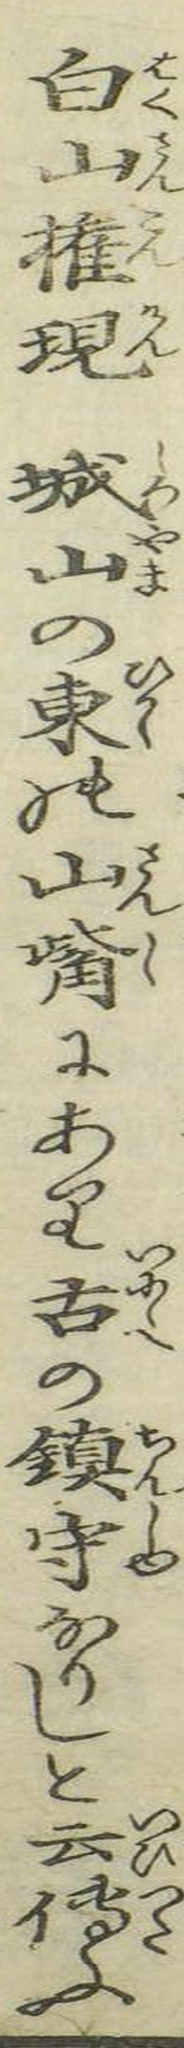白山権現城山の東の山觜にあり古の鎮守なりしと云傳ふ

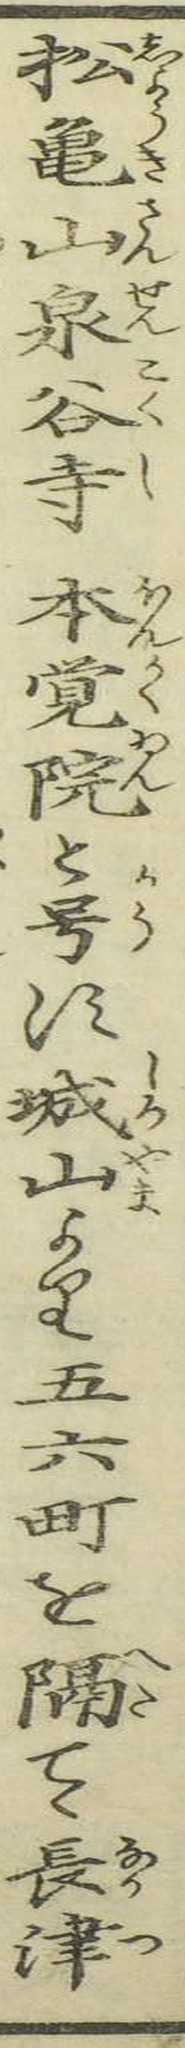松亀山泉谷寺本覚院と号す城山より五六町を隔てゝ長津
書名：江戸名所図会 20巻 巻之5
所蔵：東京学芸大学教育コンテンツアーカイブ
